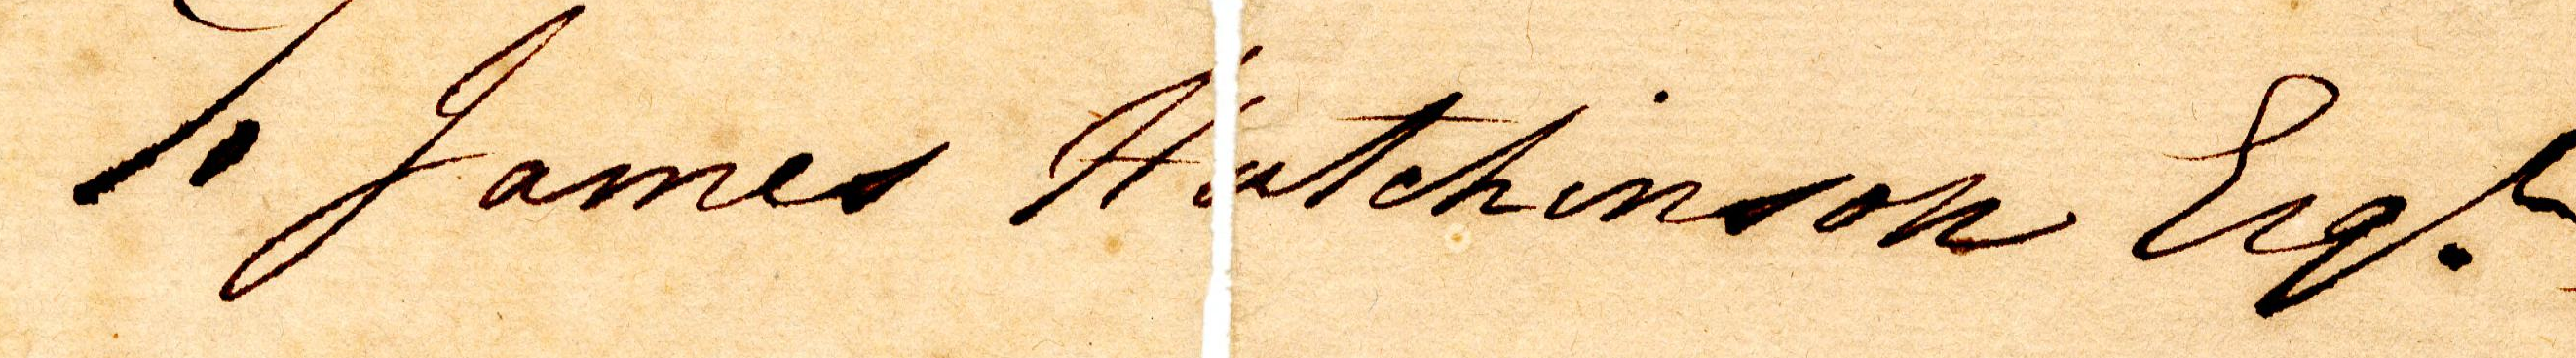To James Hutchinson Esq^r.
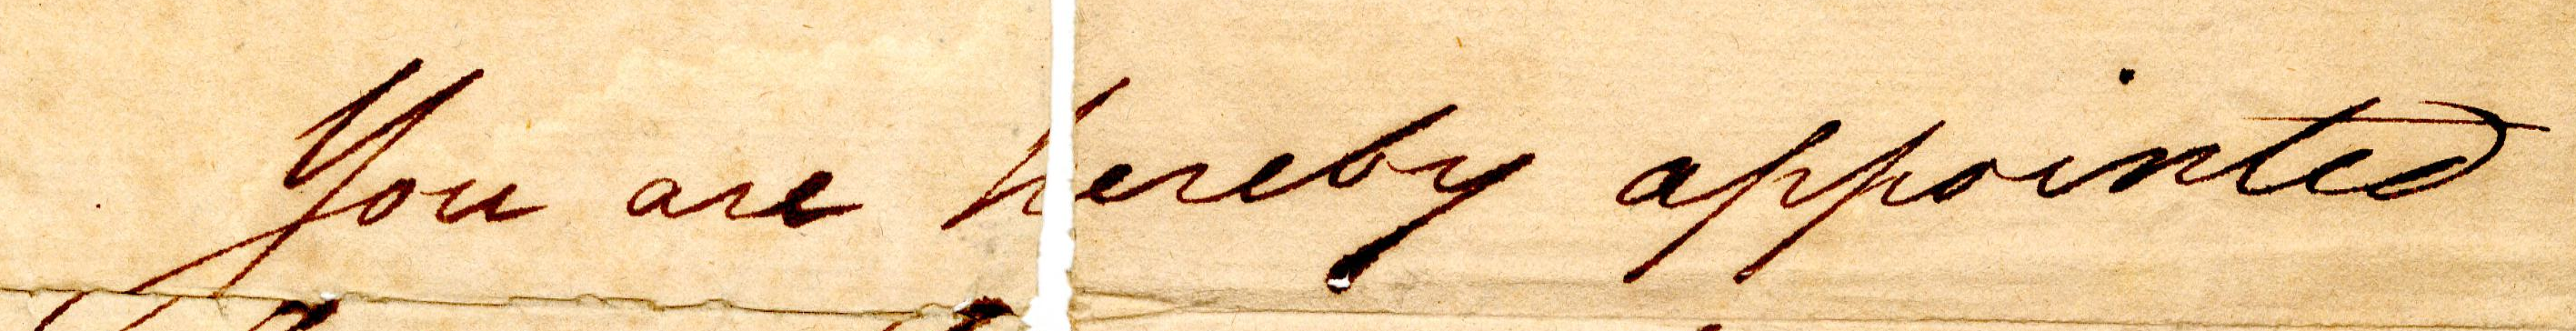You are hereby appointed
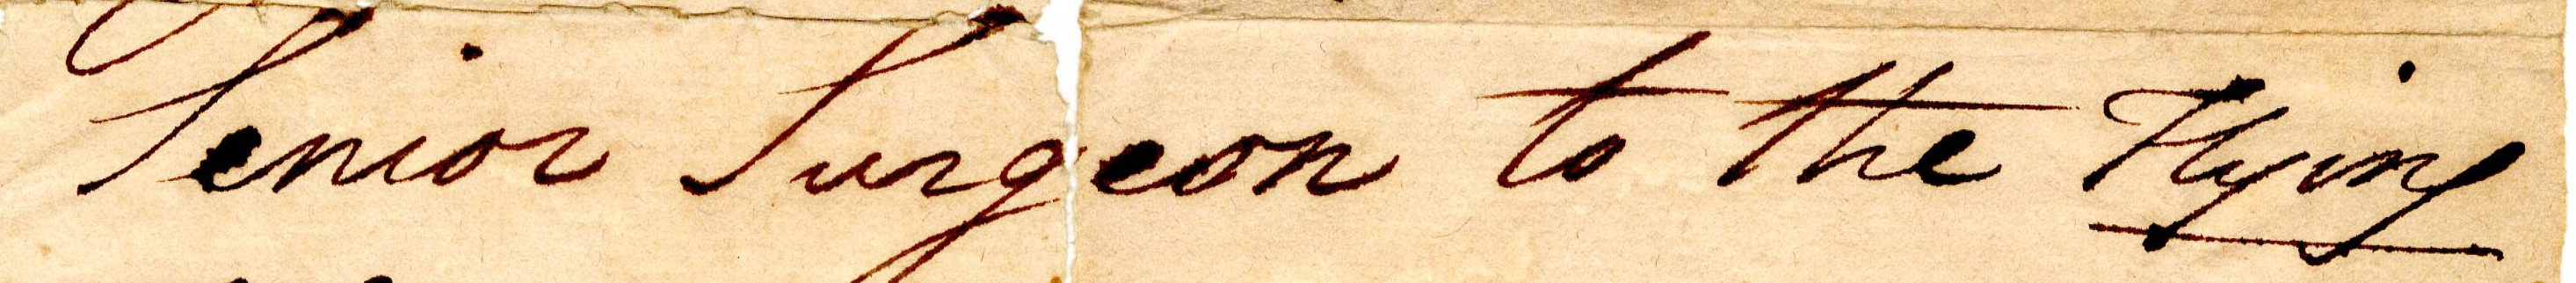Senior Surgeon to the Flying
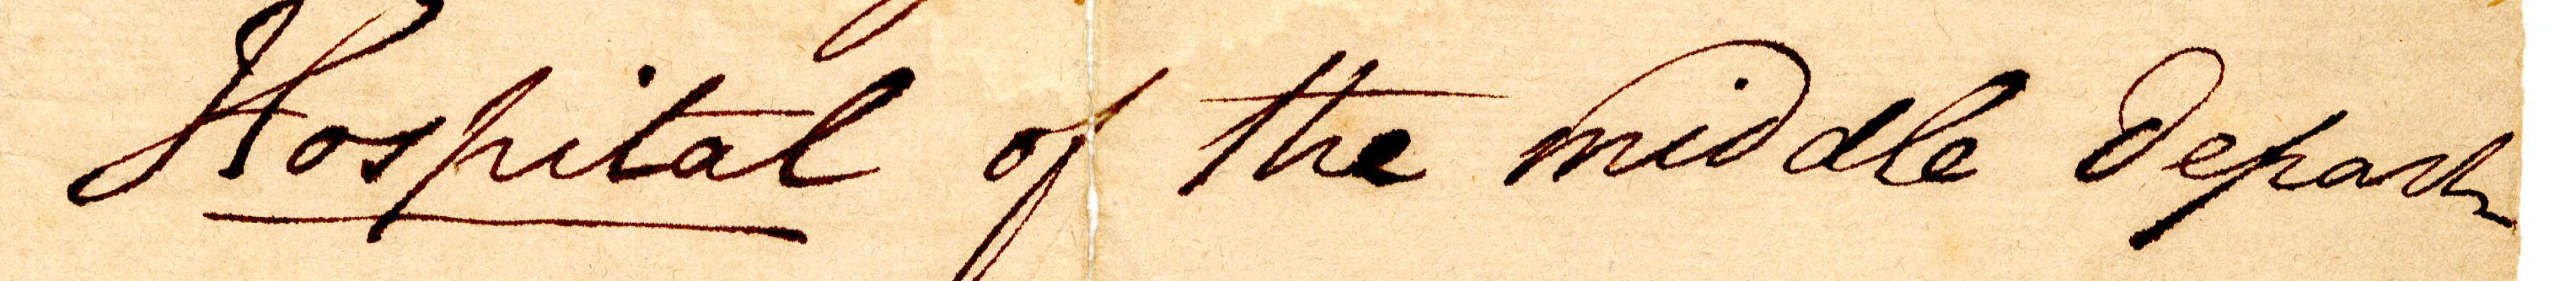Hospital of the middle depart
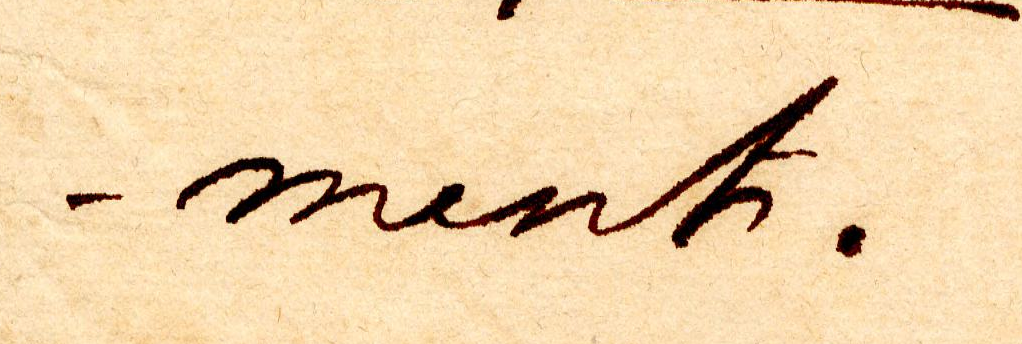-ment.
